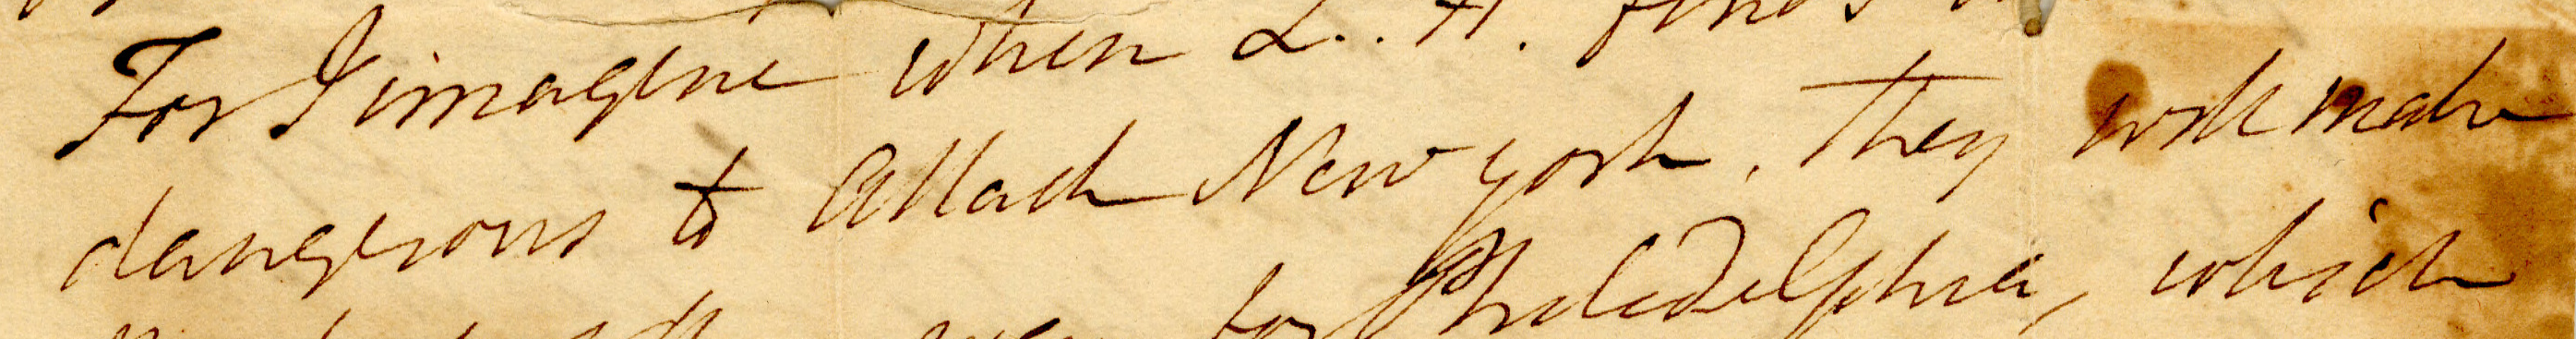dangerous to Attack New York, they will make
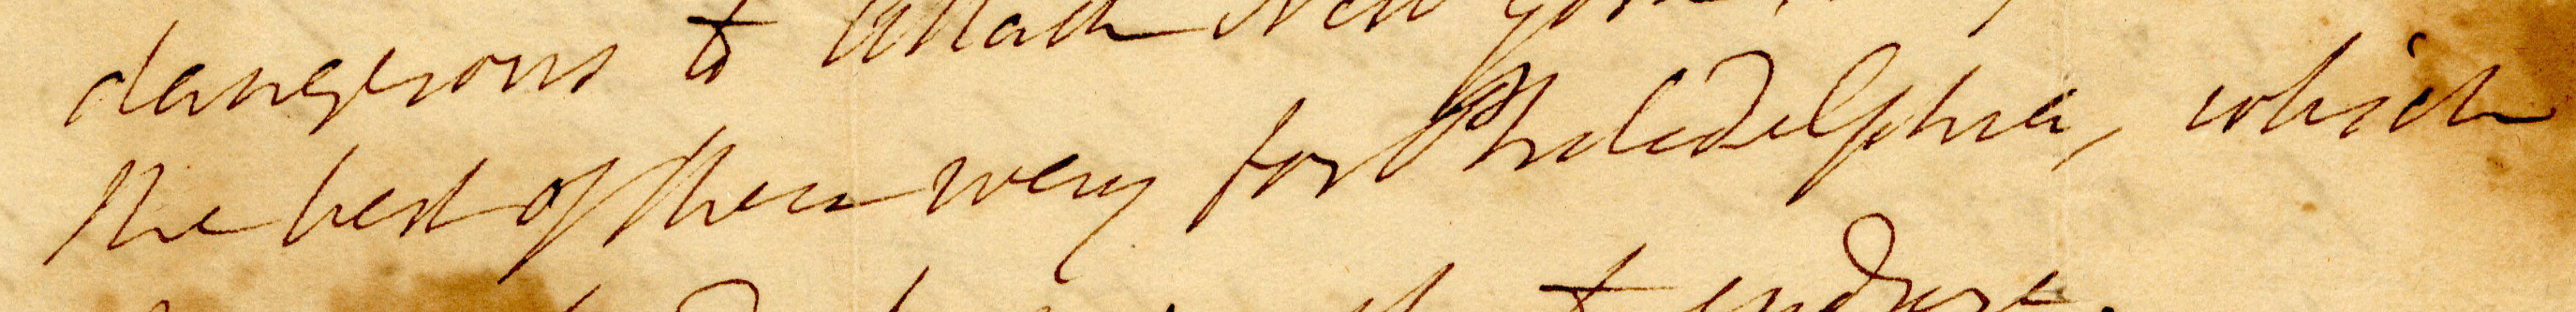the rest of their way for Philadelphia, which
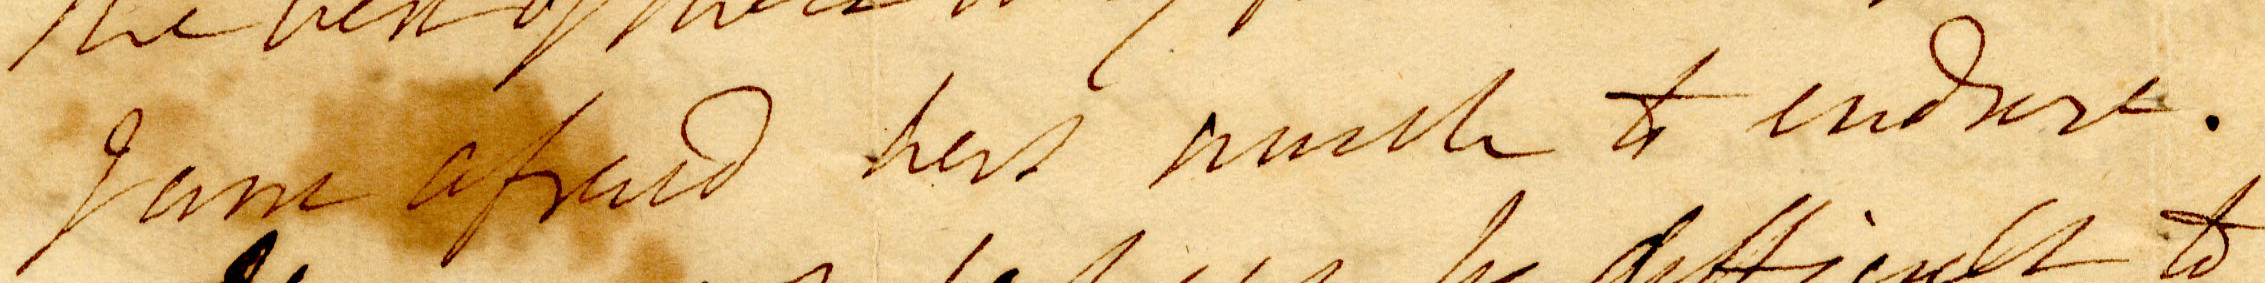I am afraid has much to endure.
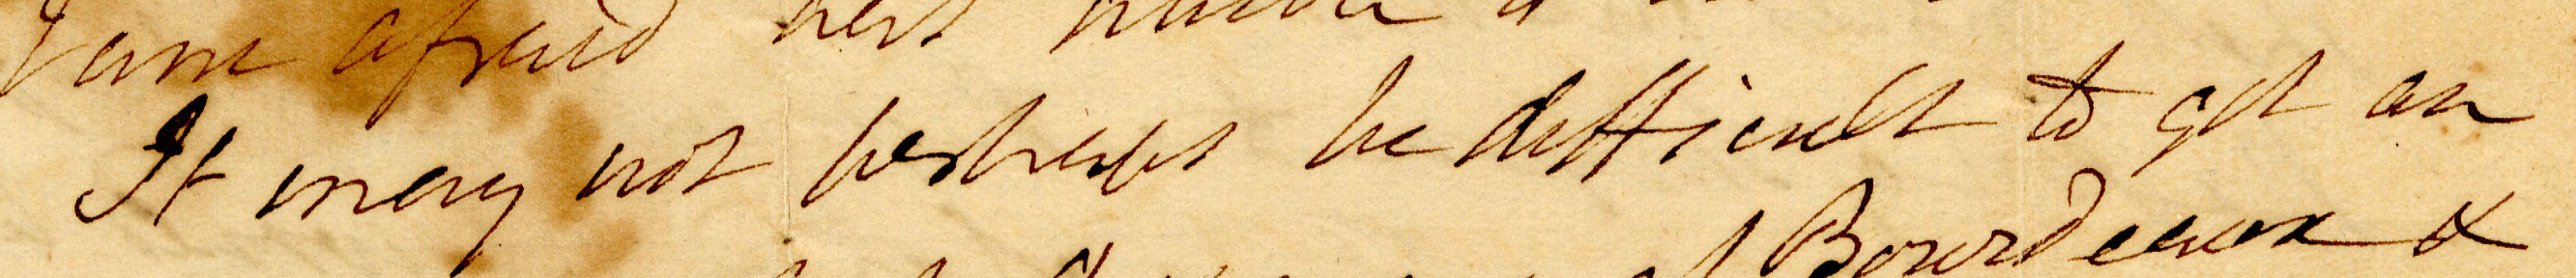It may not perhaps be difficult to get an
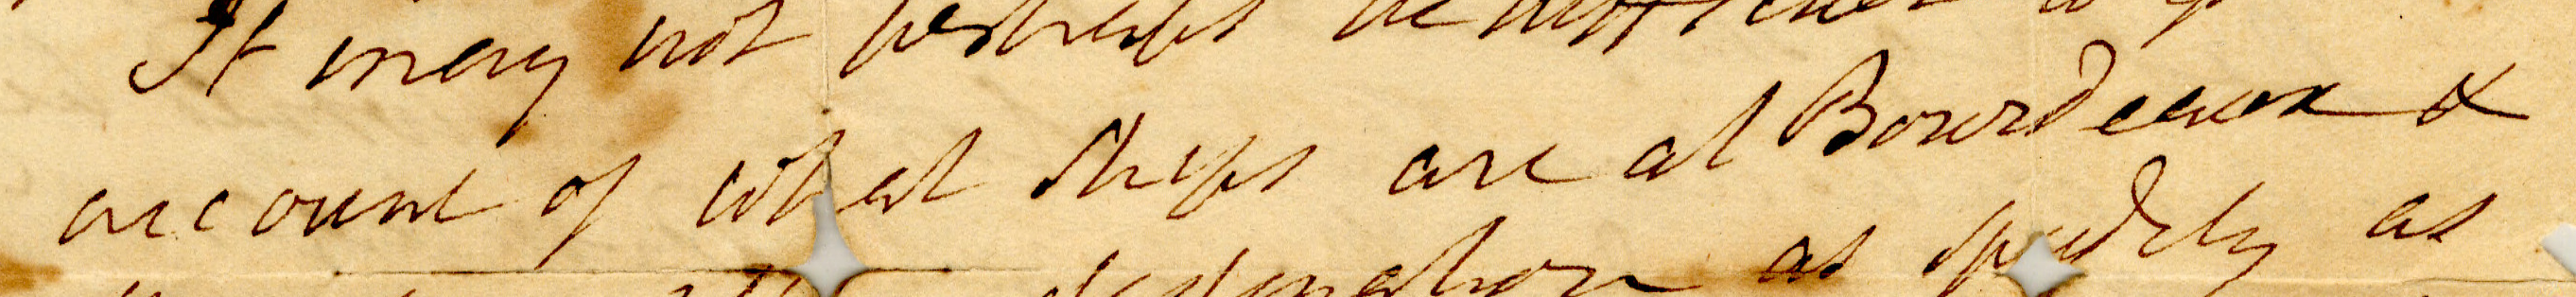account of what ships are at Bourdeaux &
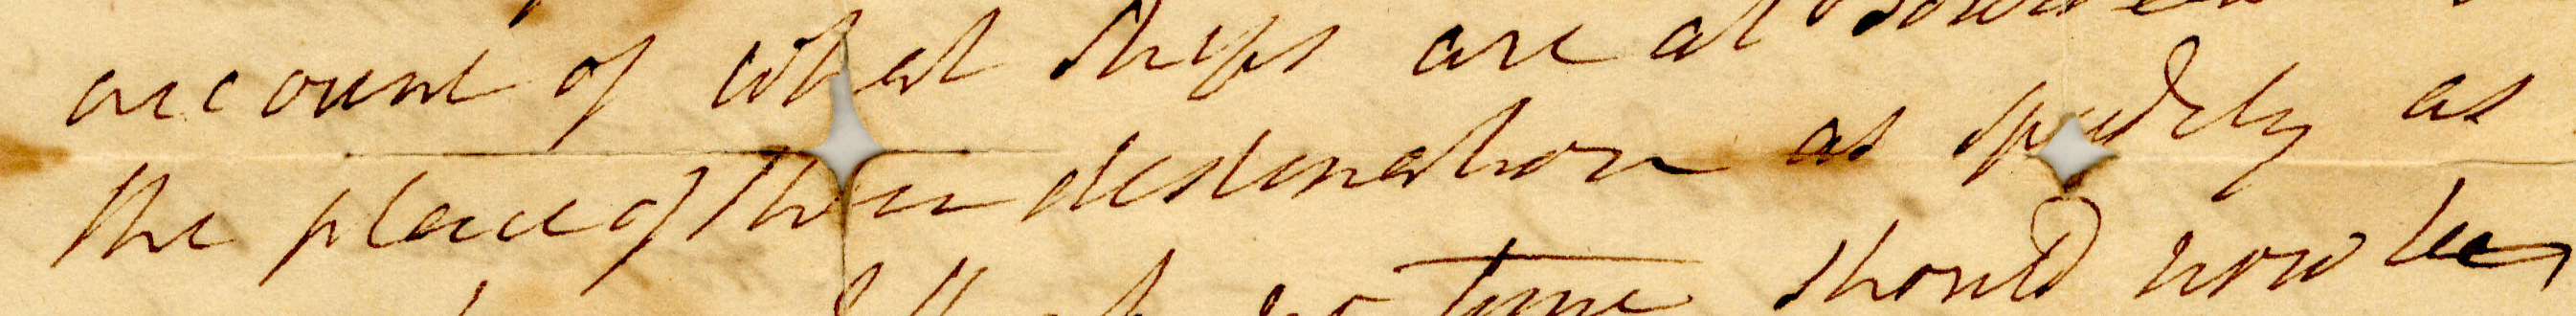the place of his destination as speedly as
